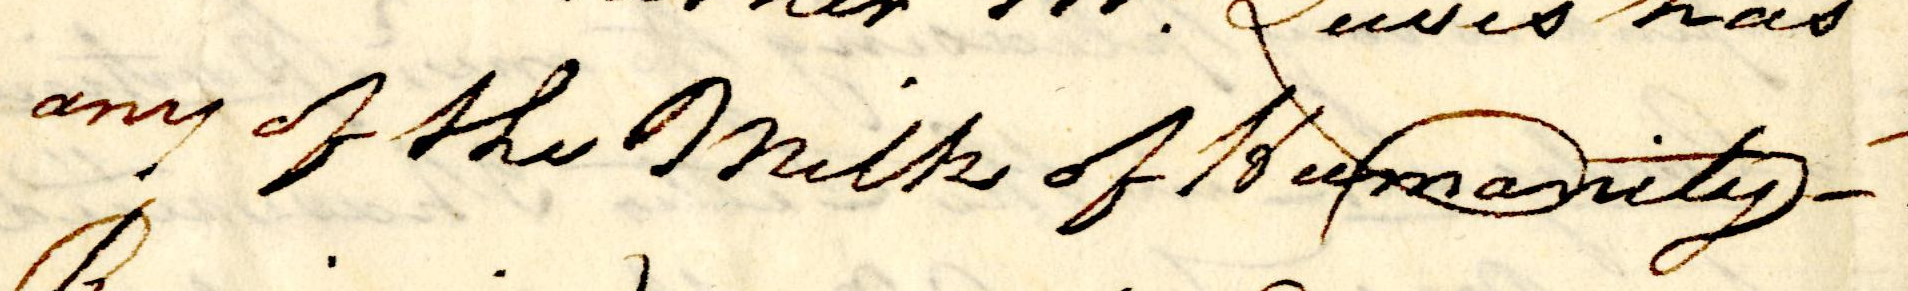any of the milk of Humanity
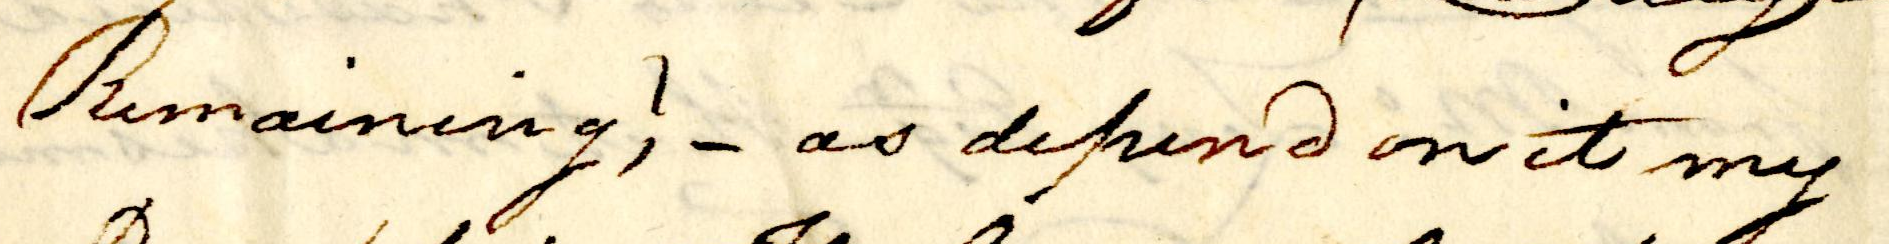Remaining;- as depend on it my
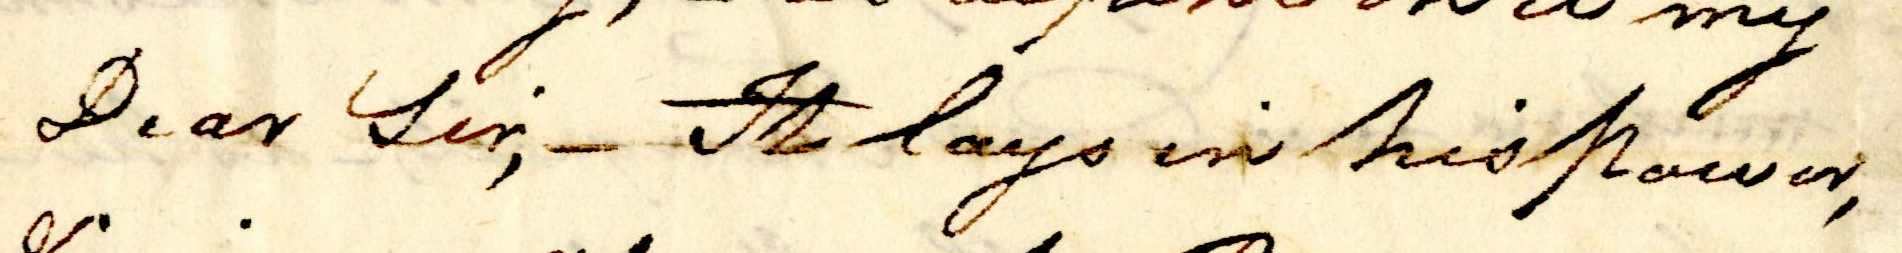Dear Sir;- It lays in his power
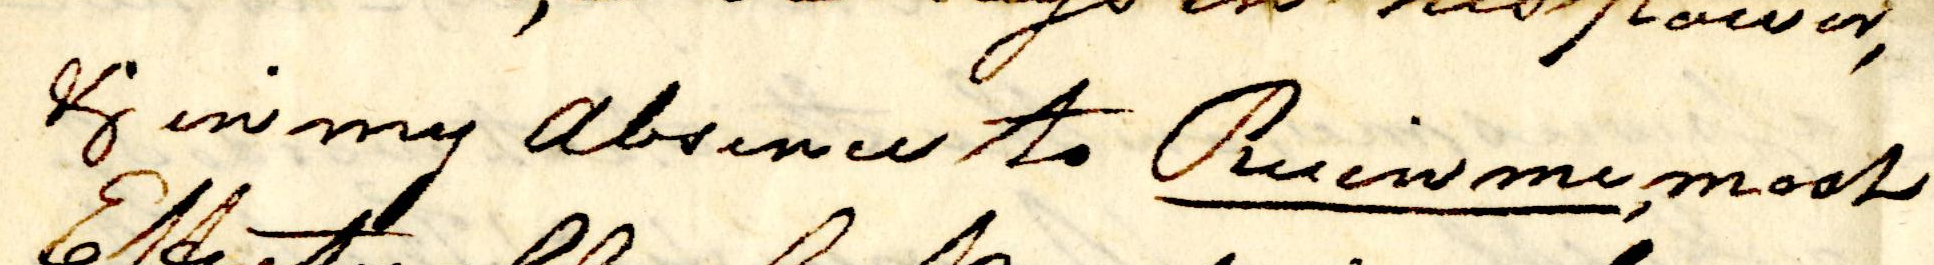& in my Absence to Ruin me mail
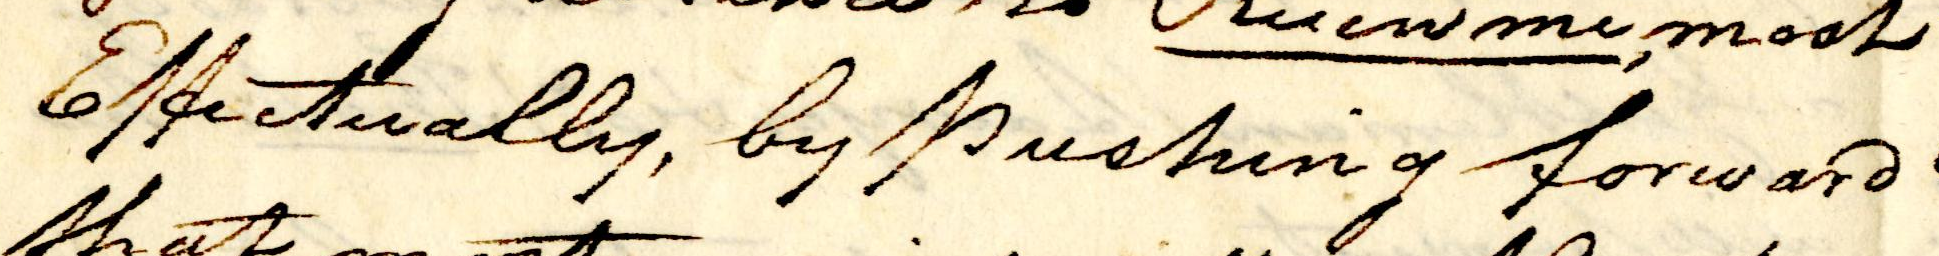effectually, by Pushing forward
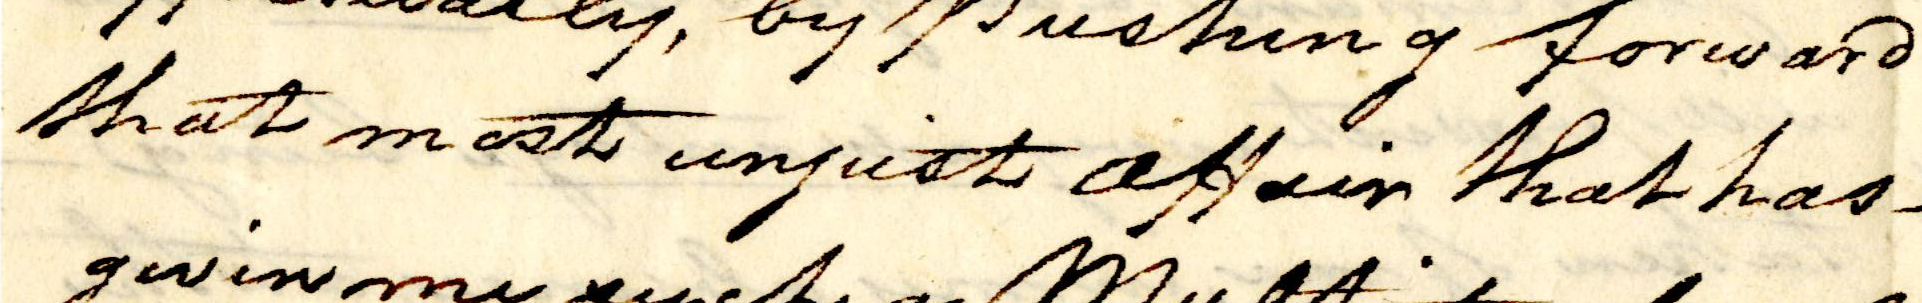that most unjust affair that has
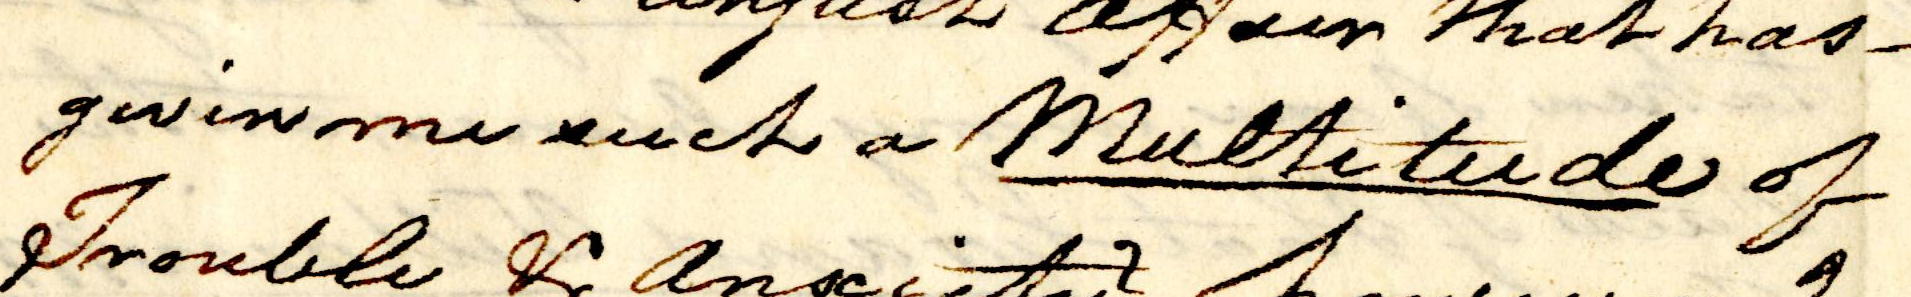given me such a multitude of
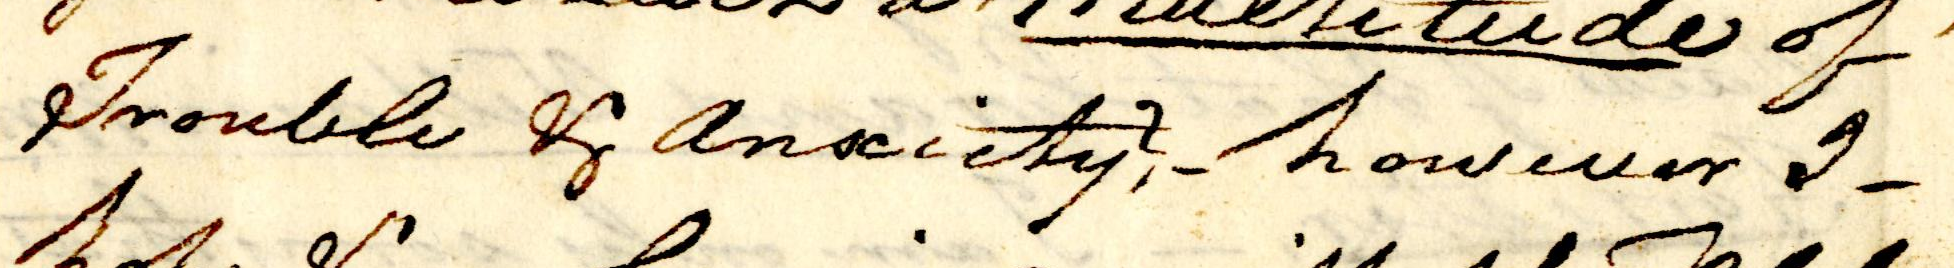trouble & anxiety?- however I
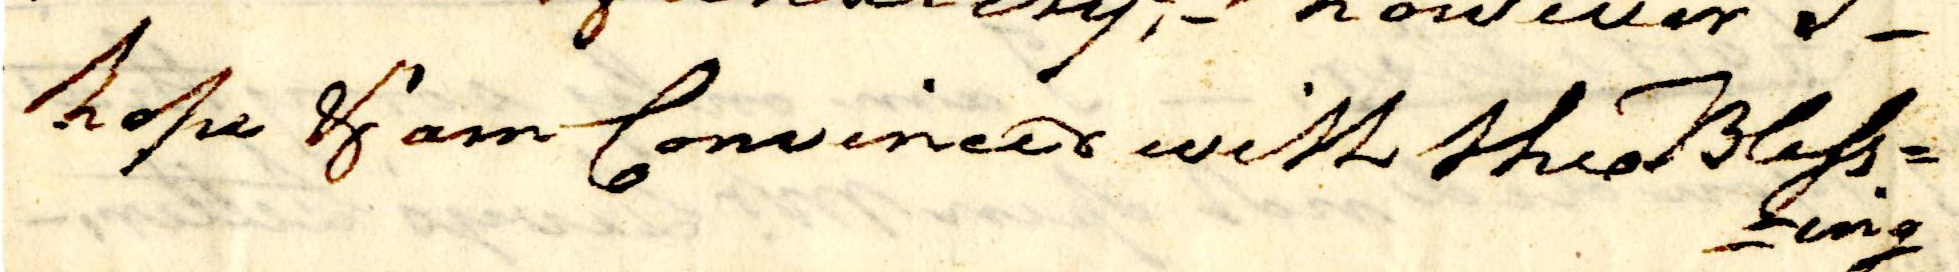hope & am Convinced with the Bless-
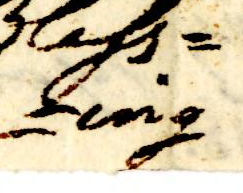-ing
